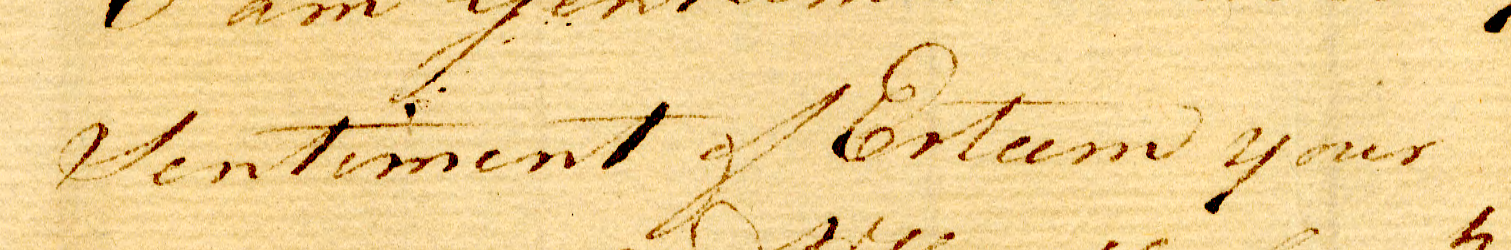Sentiment of Esteem your
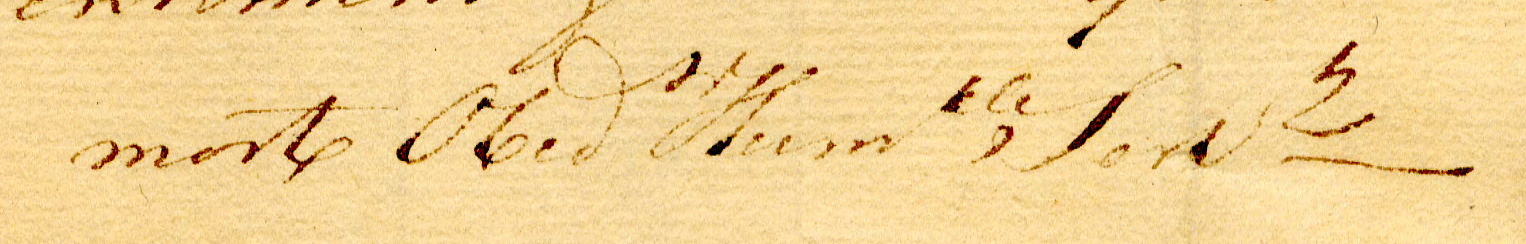most Obed^t Hum^ble Serv^t-
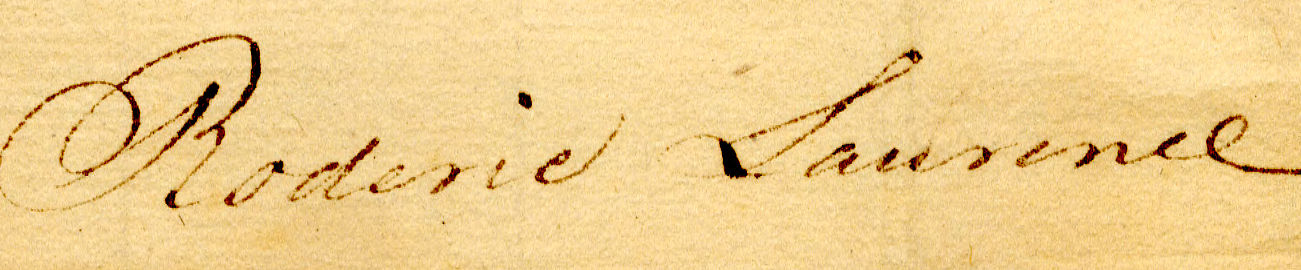Roderic Lawrence
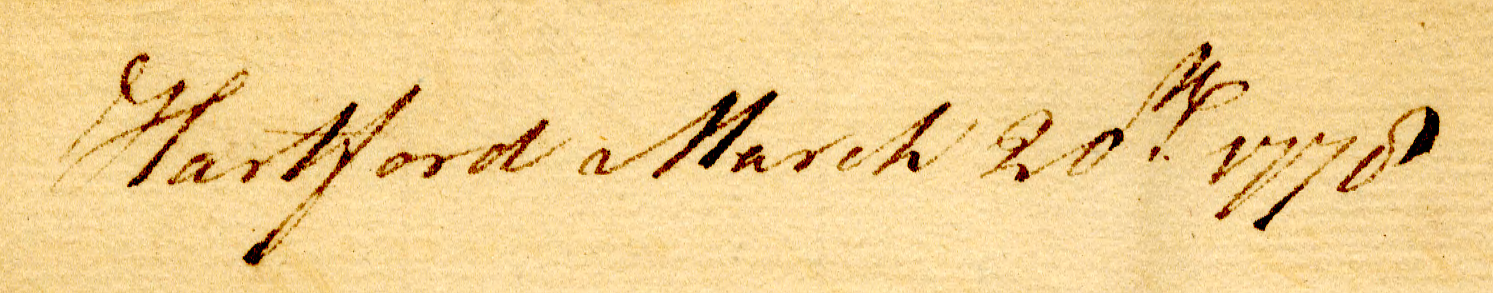Hartford March 20^th 1778
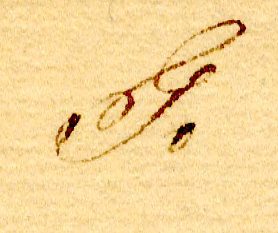To
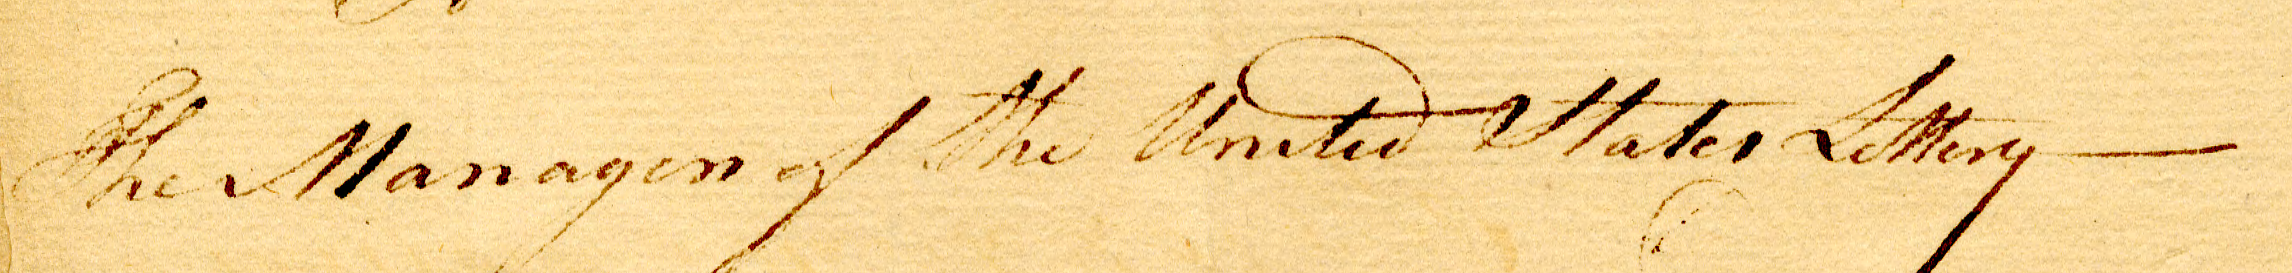The Managers of the United States Lottery-
